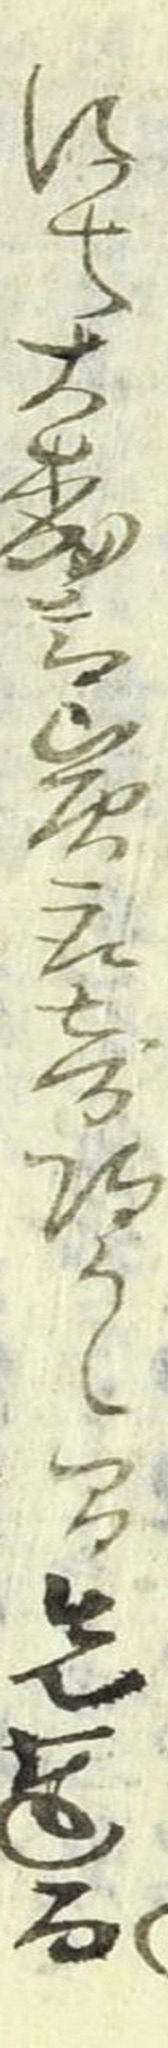得者大森ニ而炭取寄帰り候間先達而
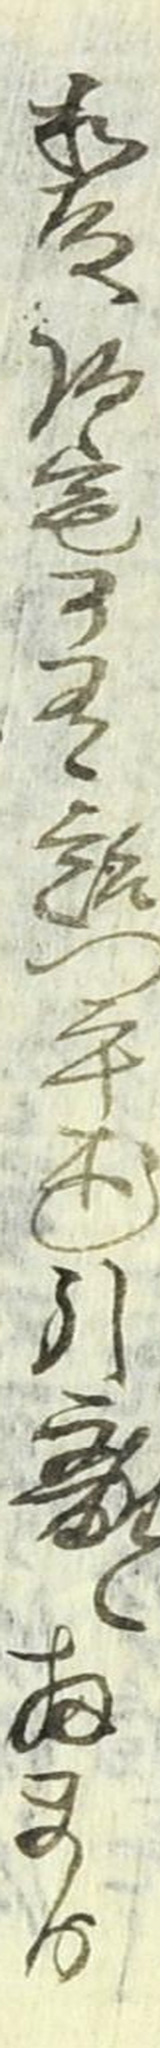和殿帰宅可有趣門平述引離候扨夫ゟ
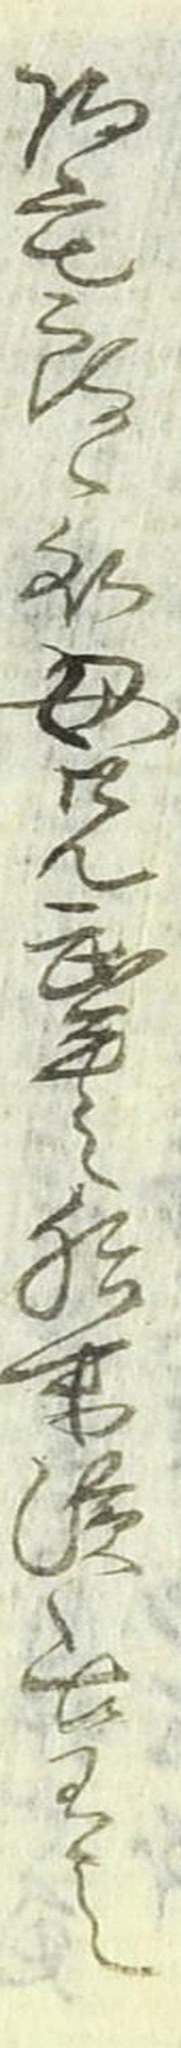帰宅致候処母兄武平之始末演舌有之
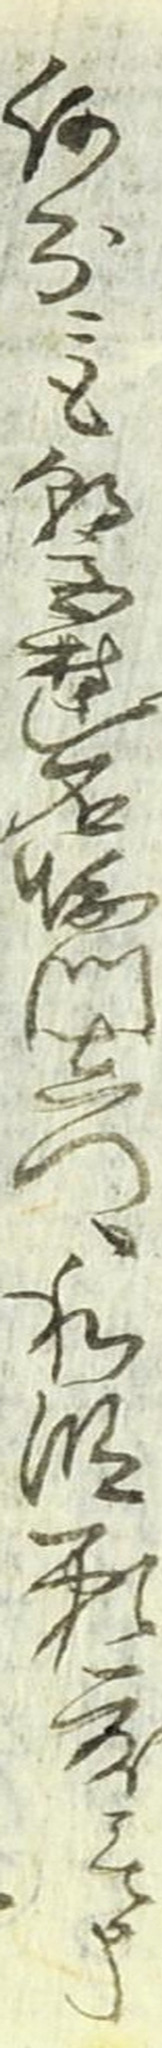何分ニも朝宮村岩堀門在門へ和段頼度被申
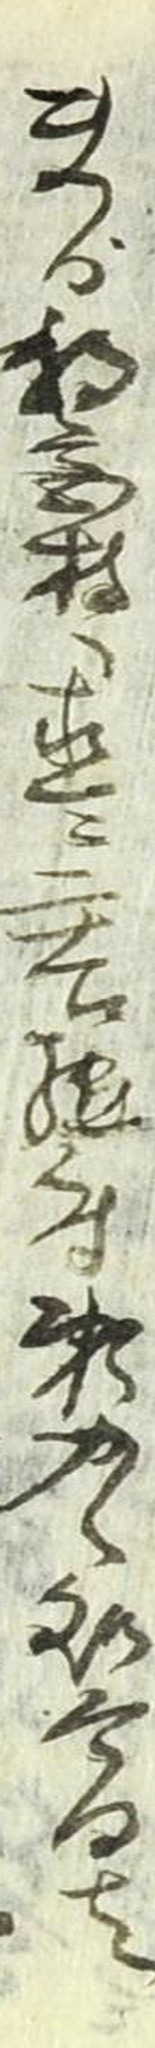夫ゟ朝宮村へ直ニ二吉馳付頼入候処今日者
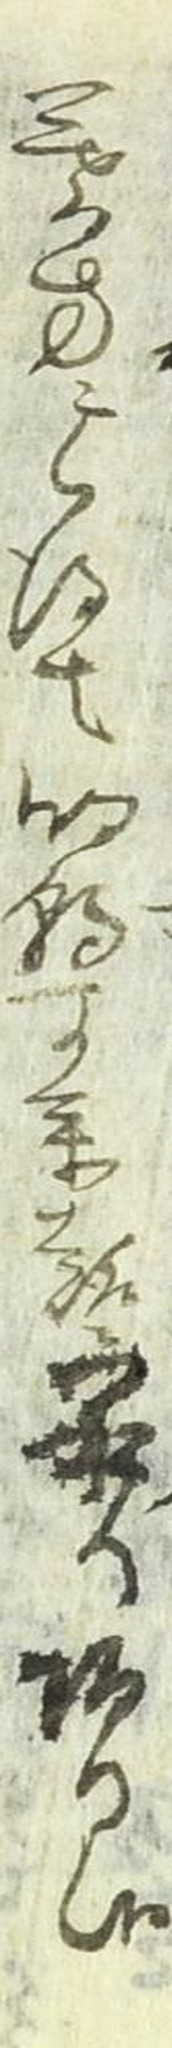暮方ニ候得者明朝可来趣ヲ承り帰り候
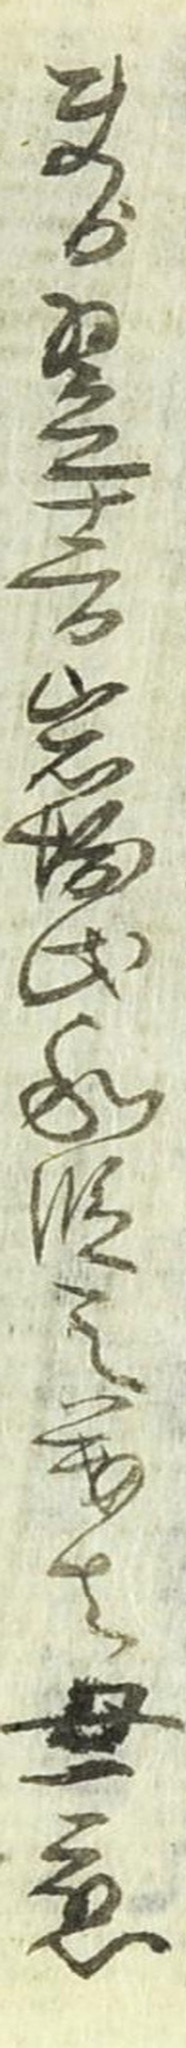夫ゟ翌十二日岩堀氏和段之義者母一応
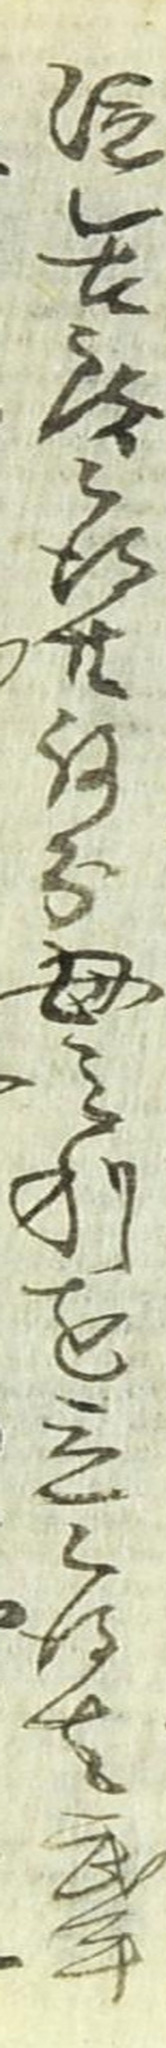演舌致候得共何分母之利を立候得者武平
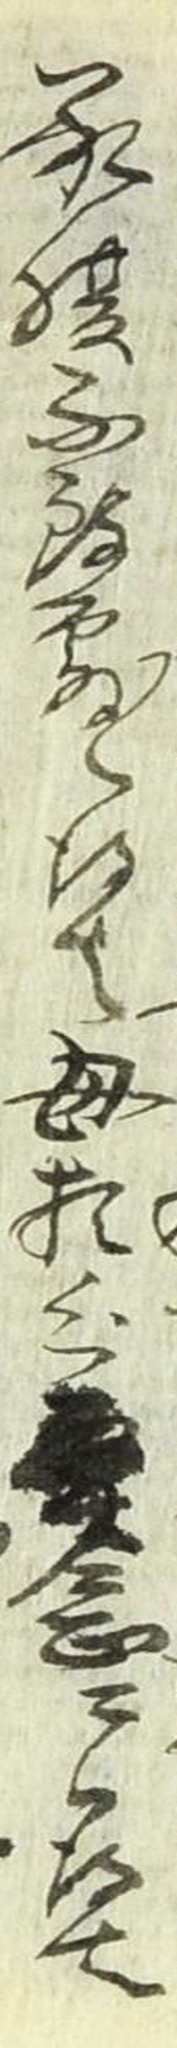承腹不致処候得者母相分無念ニ候得者
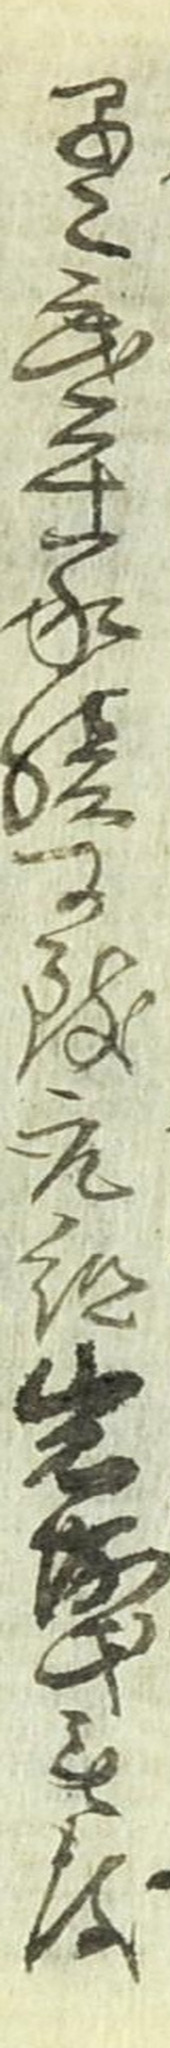早々武平承腹可致取組岩堀氏被致
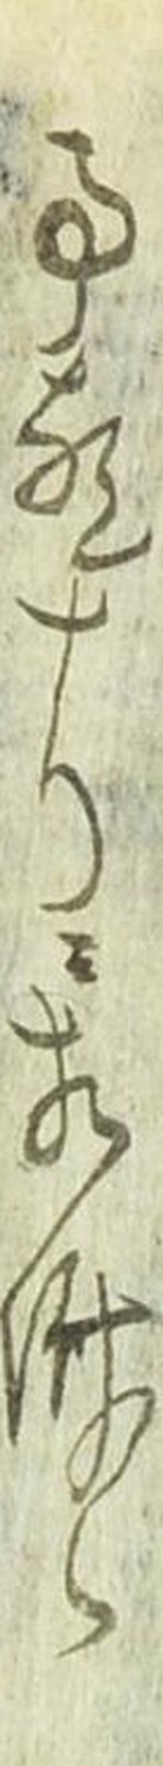事歟十月ニ相済候
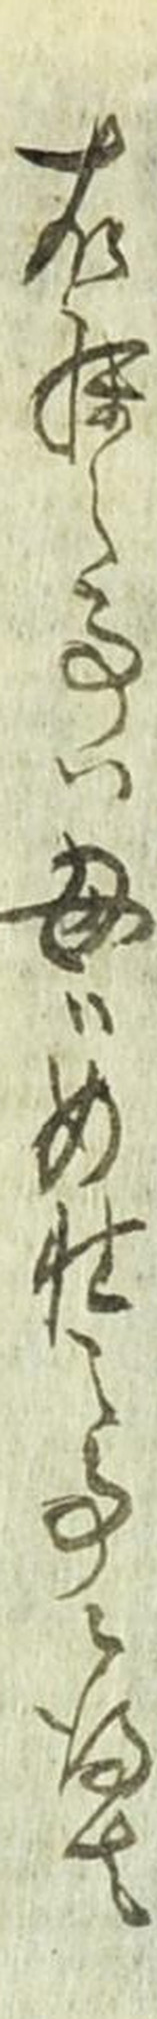右様之事ハ母ハ女性之事ニ候得者

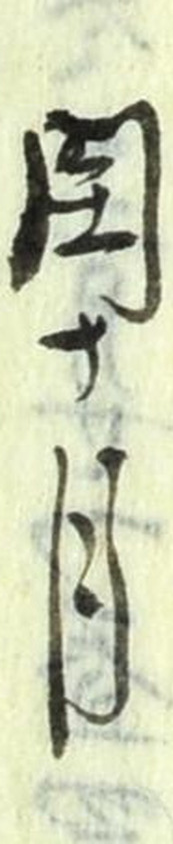閏十月
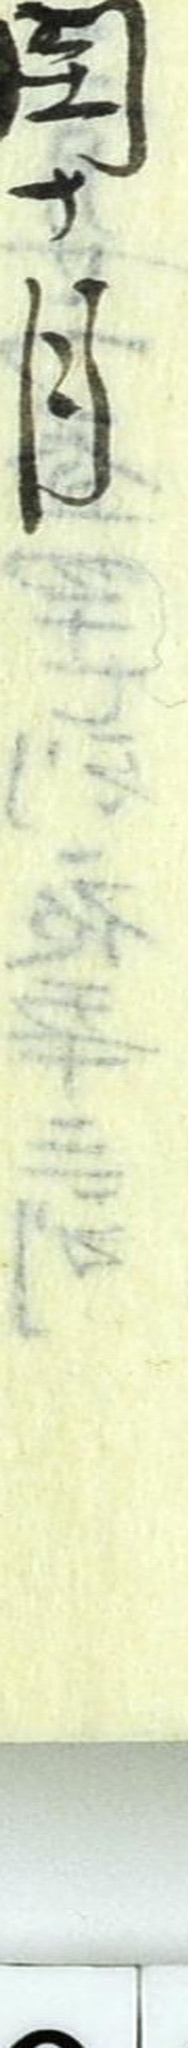閏十月
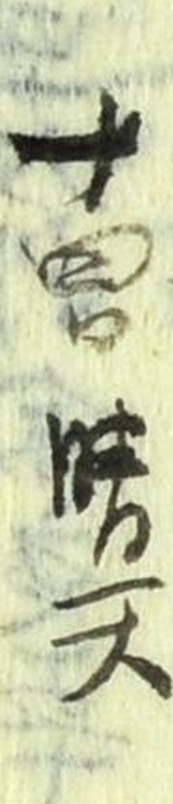十五日晴天
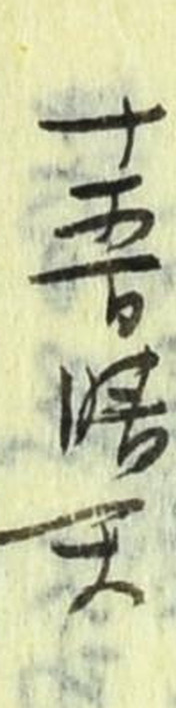十五日晴天
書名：（日記）
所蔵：福井県文書館 Fukui Prefectural Archives
